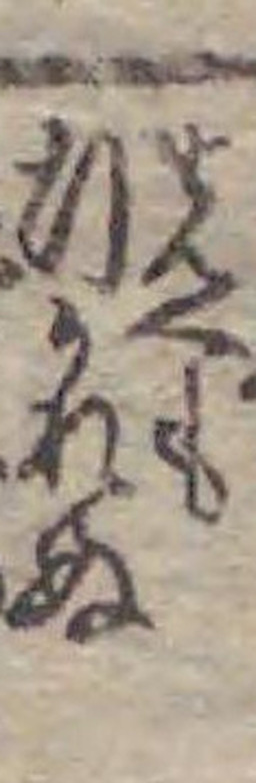引かれぬ
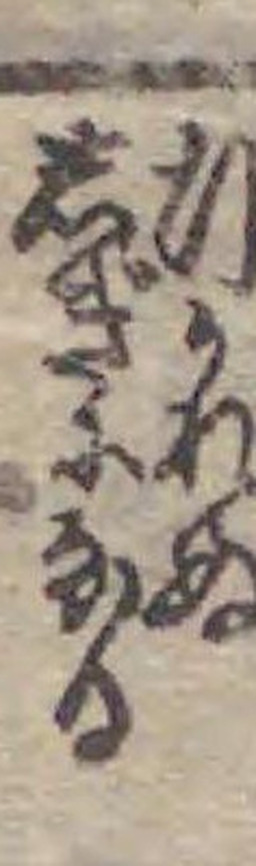しぎになる
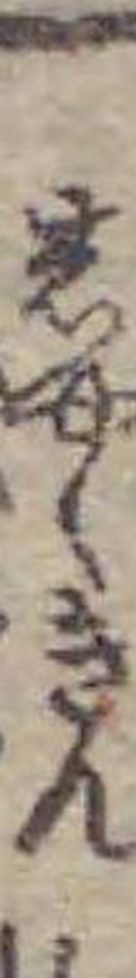しやくきん
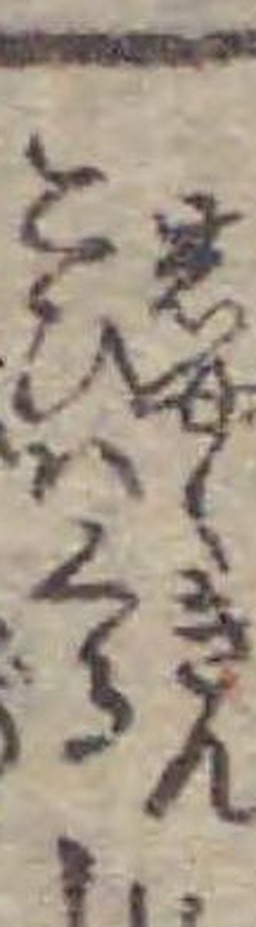こひはくる
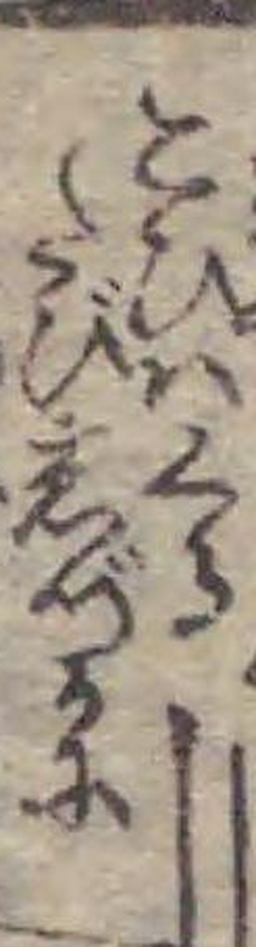たびしづかに
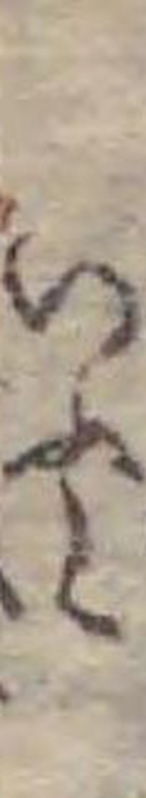いふと
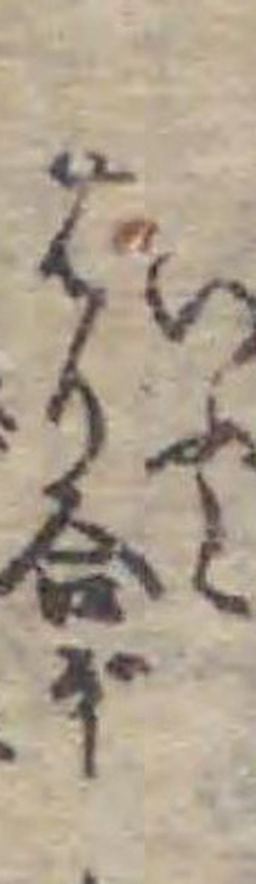はり合が
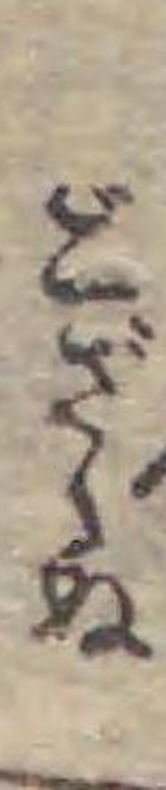ござらぬ
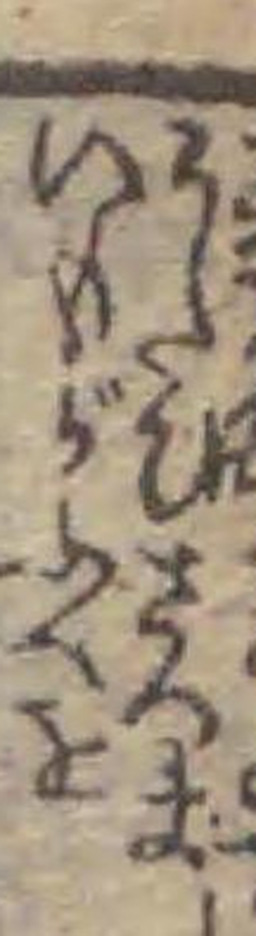いもがふへを
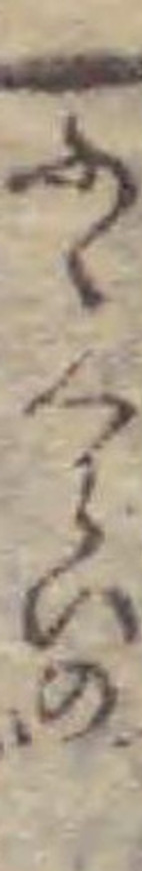ふくくらいの
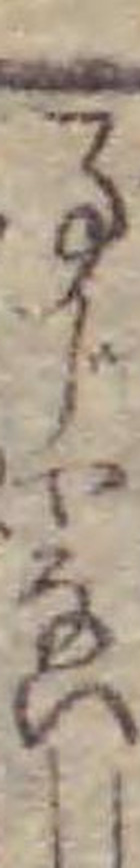事じやない
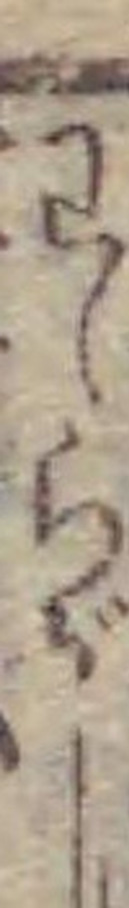わしらが
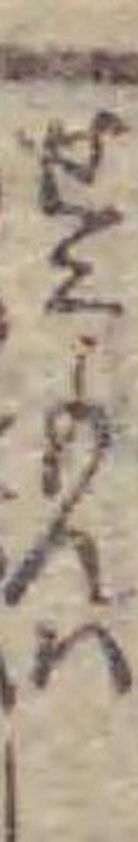せるもんは
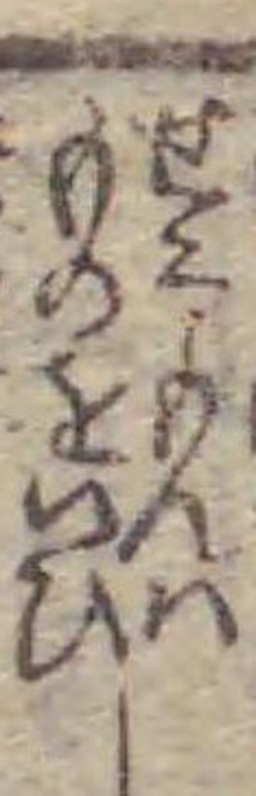ものをいひ
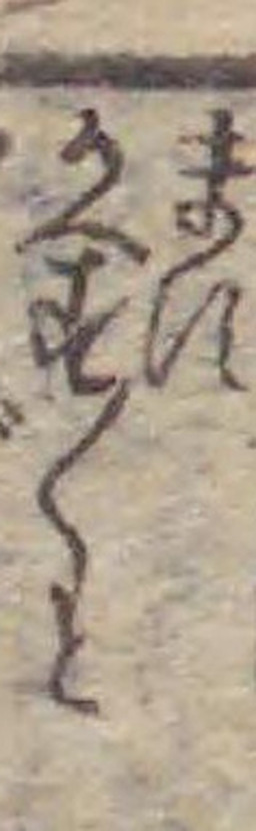かへす〳〵と
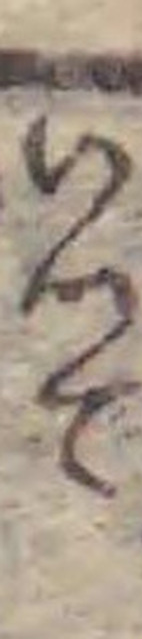いつて
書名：四遍搨心学草帋 : 3巻
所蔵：国立国会図書館 National Diet Library, JAPAN
